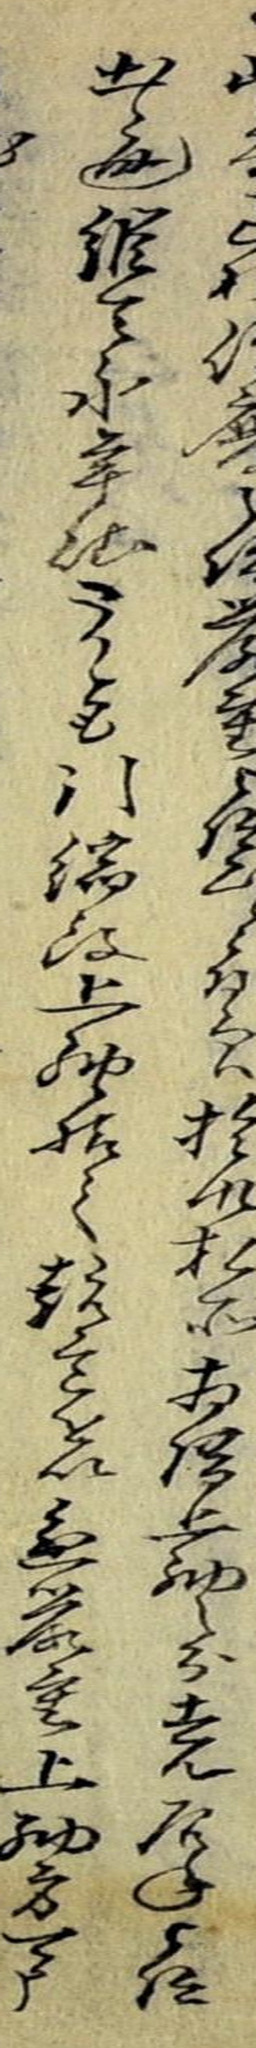出候通従令永年賦たりとも引縮致上納候様之趣意を以愈厳重上納方可申
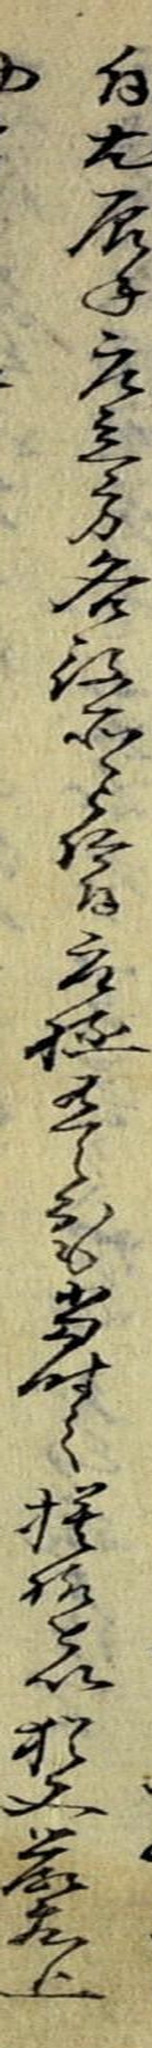付尤辰年取立方各役所へ被仰付取極有之分も当時之模様を以猶又厳敷上
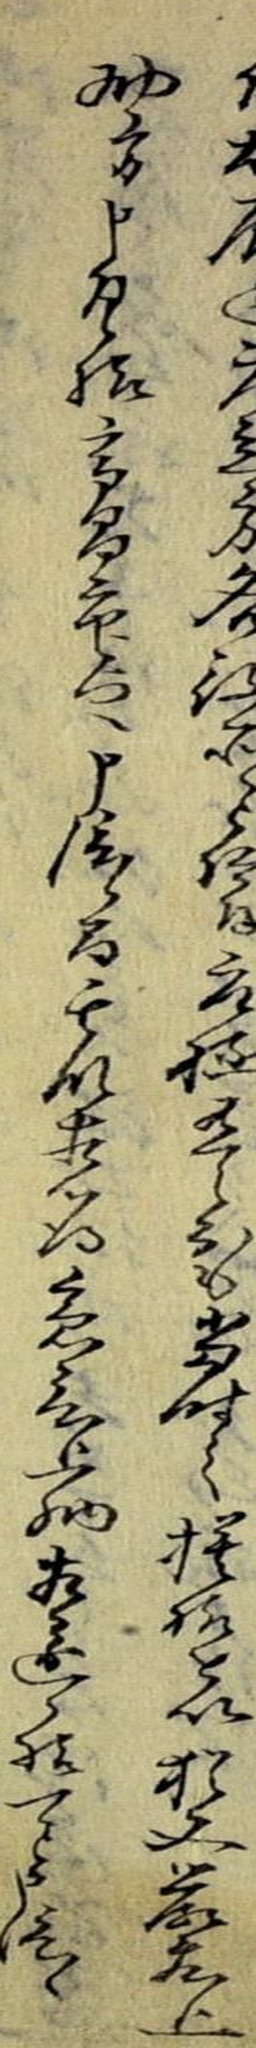納方申付候様高畠市郎右衛門へ申渡候間其段相心得急度上納相遂候様可被申渡候
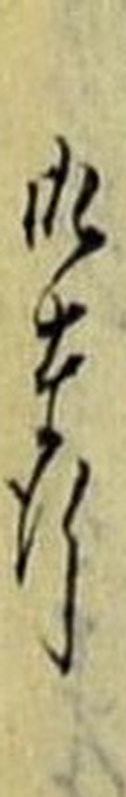御奉行
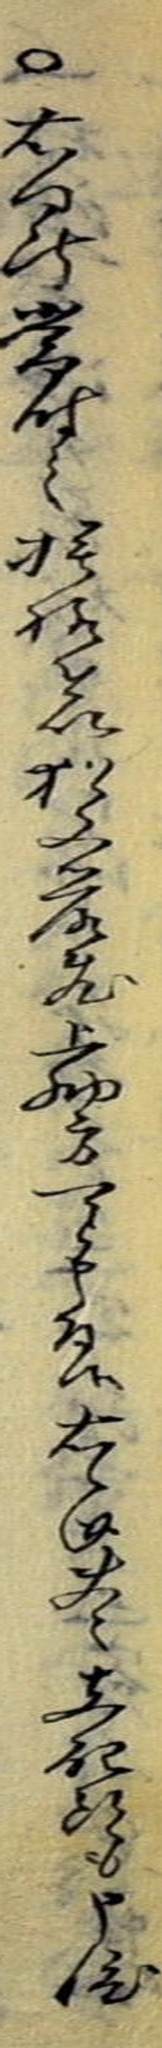○右同断当時之模様を以猶又厳敷上納方可被申付候右之趣夫々支配頭へも申渡
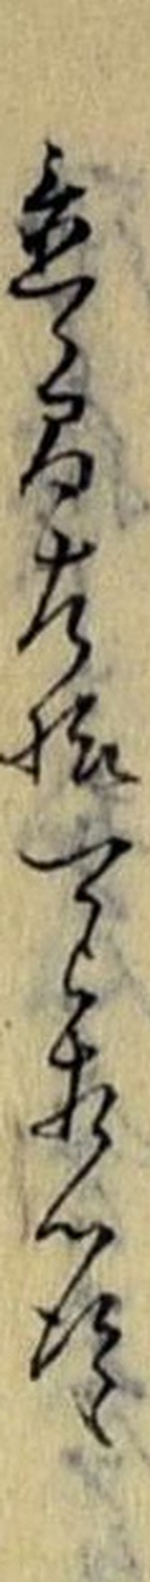置候間左様可被相心得候
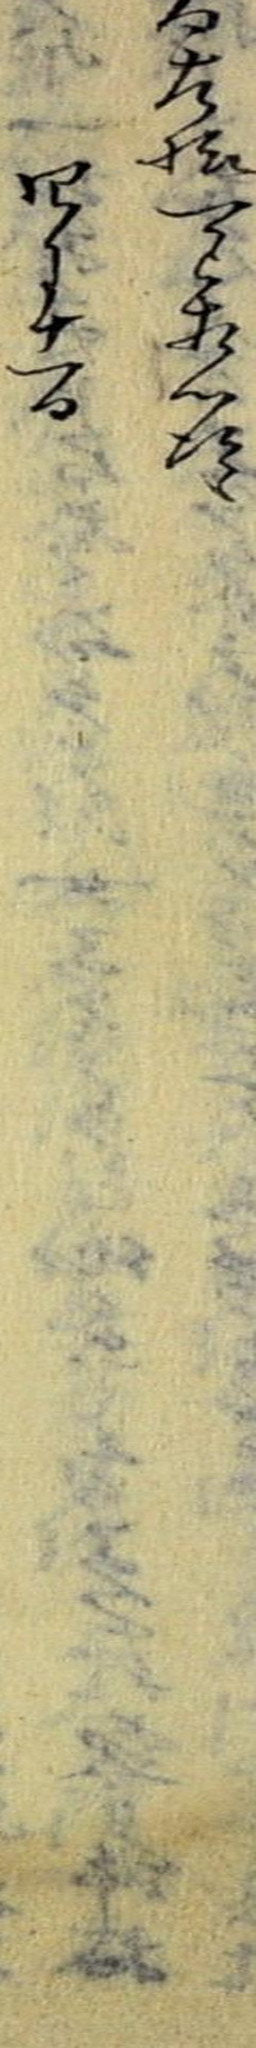四月十一日
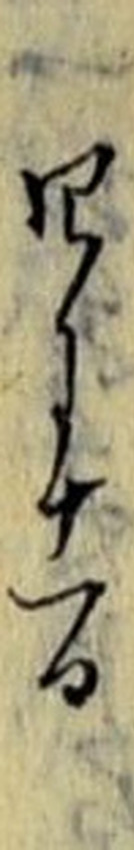四月十一日
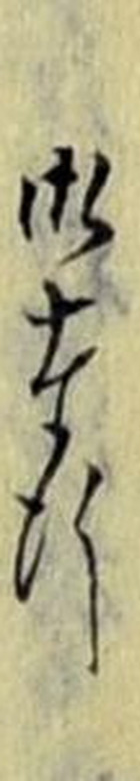御奉行
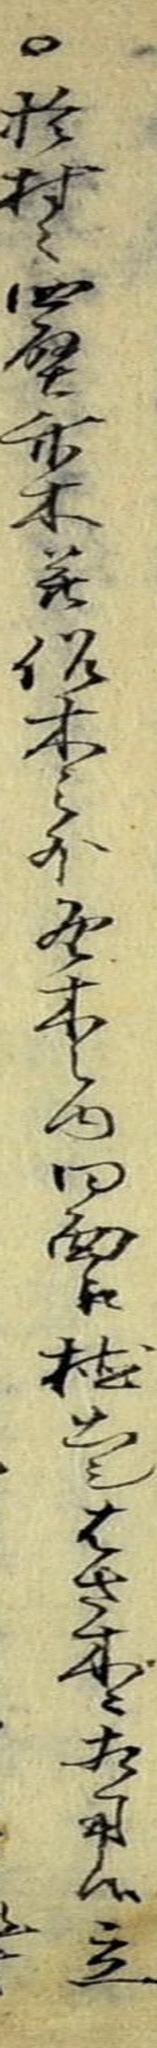○於村々四壁竹木并作木之外野木之内田面江植出しはさ木に相用候立
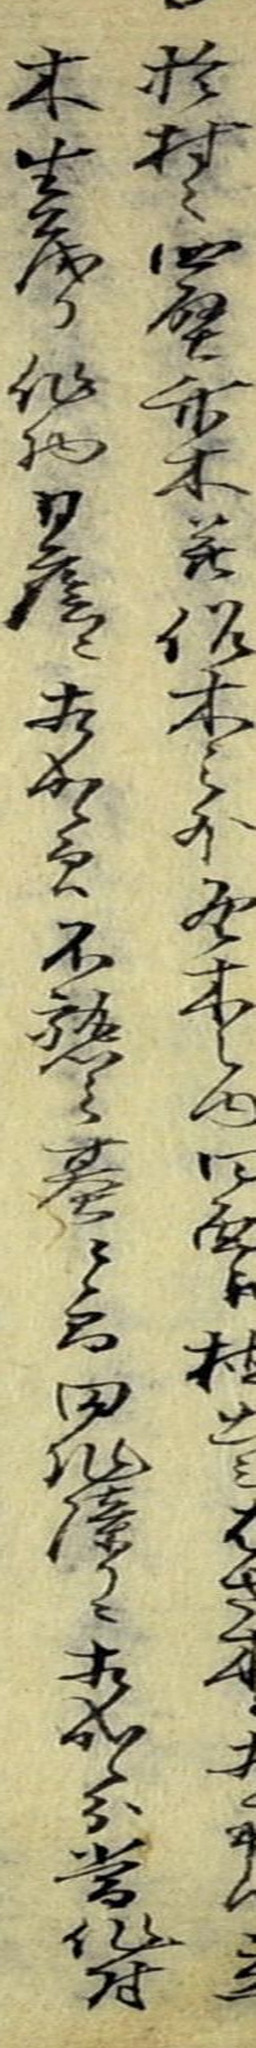木生茂り作物日蔭に相成候而は不熟之基に候間田作障りに相成候分当作付
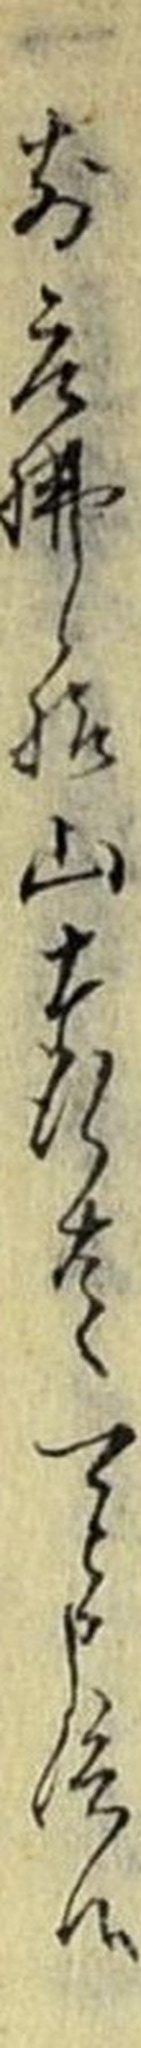前取払候様山奉行共へ可被申渡候
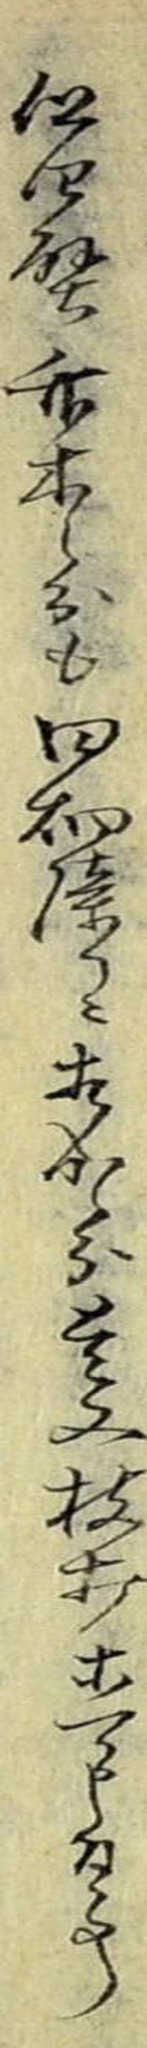但四壁竹木之分も田畑障りに相成候分是又枝打等可申付事
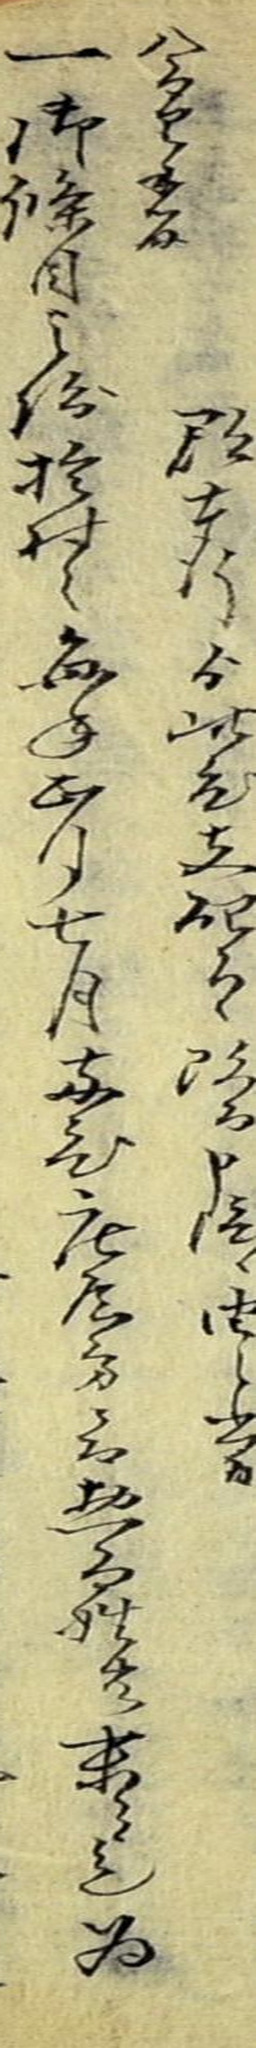一御条目之儀於村々毎年正月七月両度庄屋方に而惣百姓共末々迄為
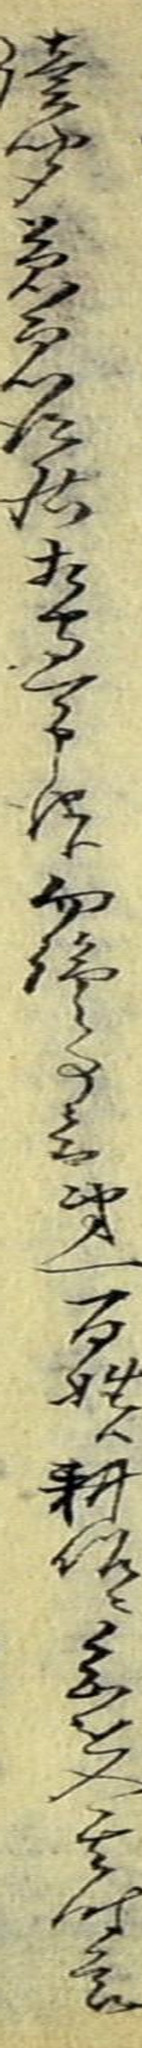読聞兼而心得居相守可申儀は勿論之事に而第一百姓は耕作に念を入其時節
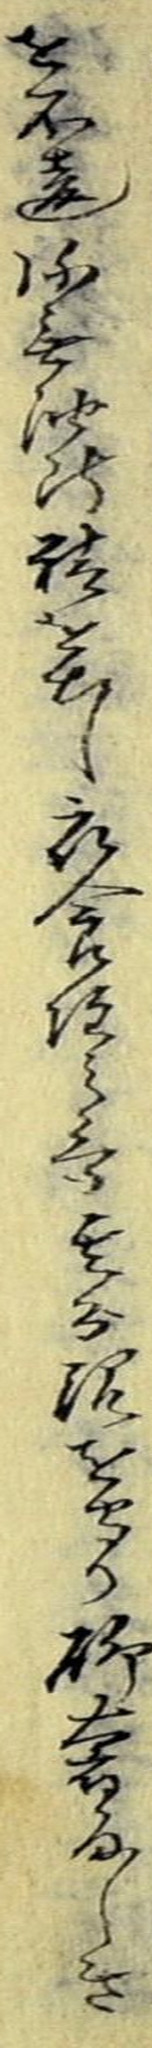を不違弥無由断精を出し衣食住之三ッ其分限を守り聊奢ましき
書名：命令之部 六
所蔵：福井県文書館 Fukui Prefectural Archives
